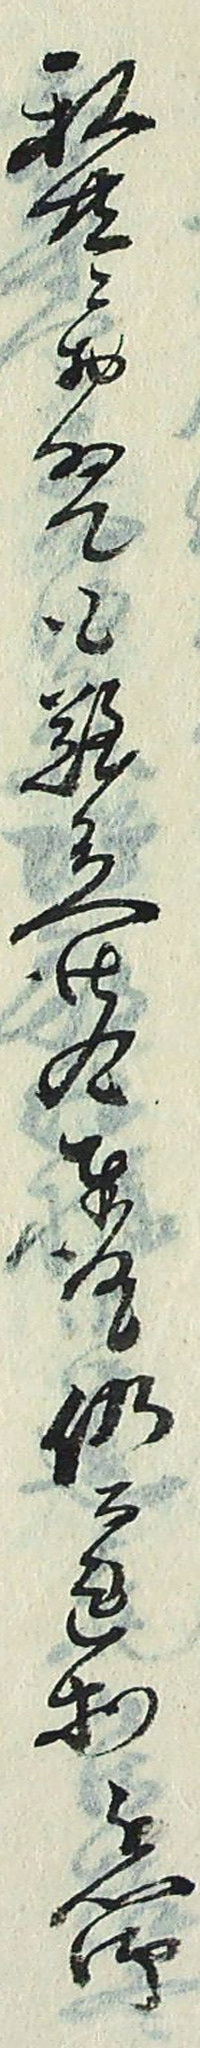私共ニおゐても難有仕合奉存候仍而連判を以御
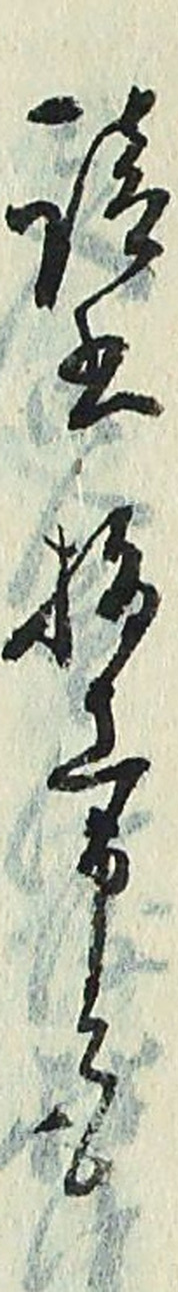請書指上申候以上
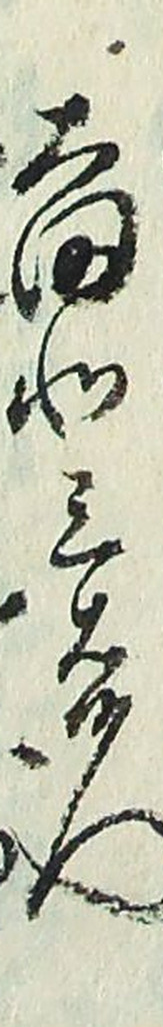大田和三右衛門
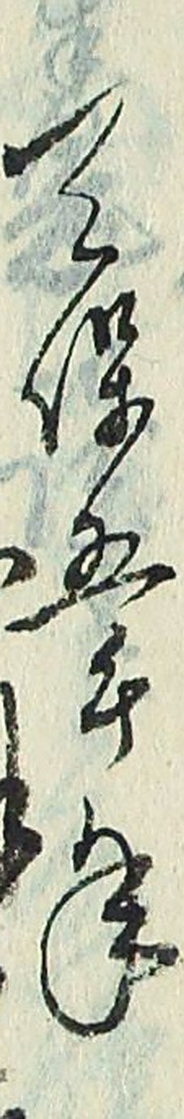天保五午年
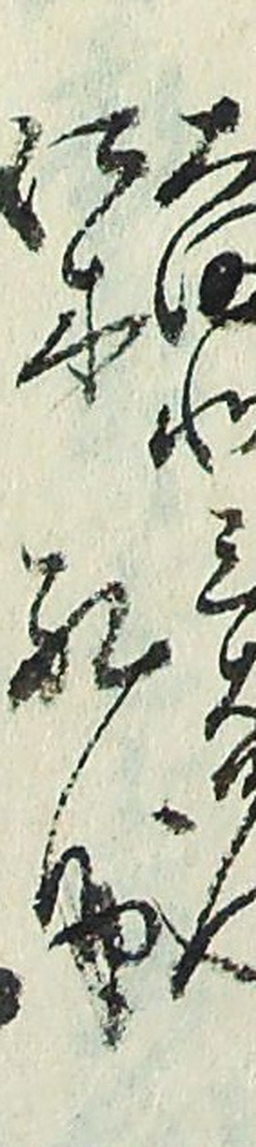仁木礼助
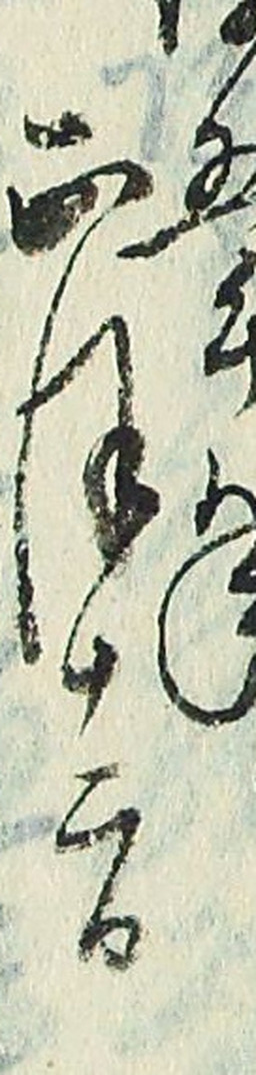正月十一日
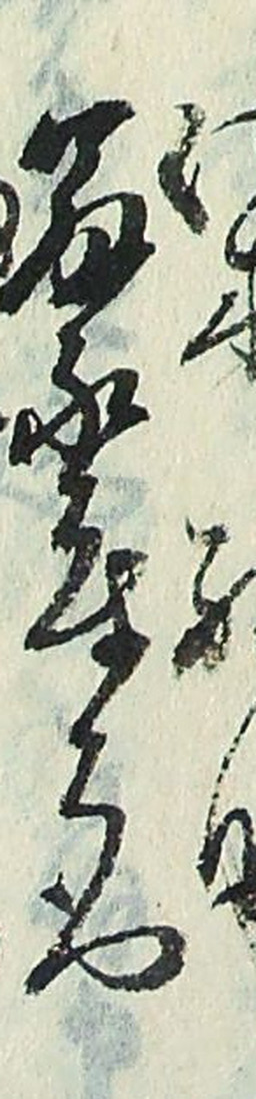富永茂右衛門
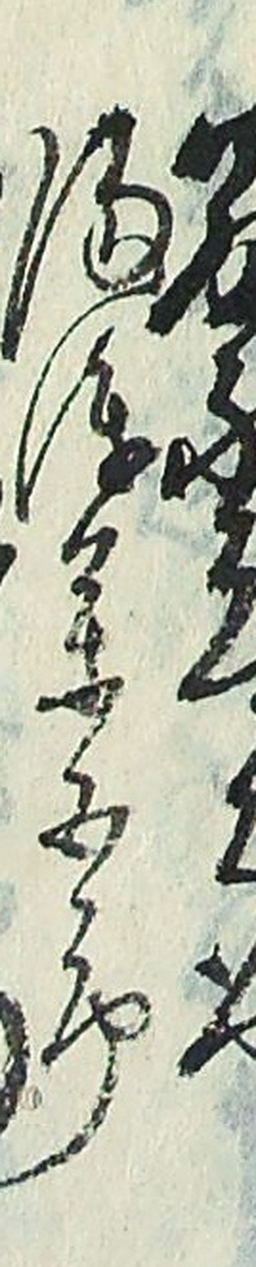湯浅栄五郎
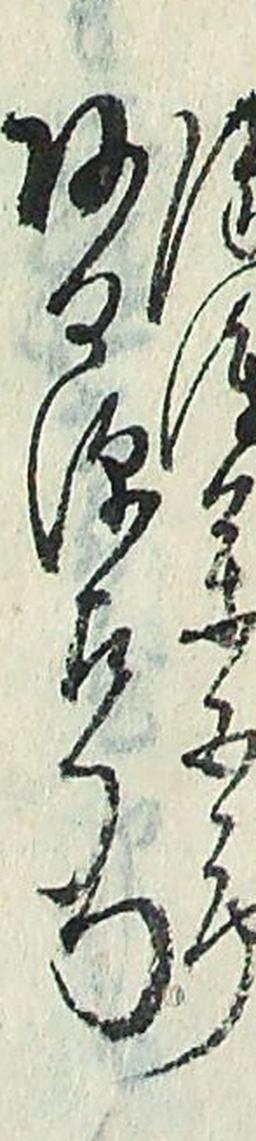阿部源左衛門

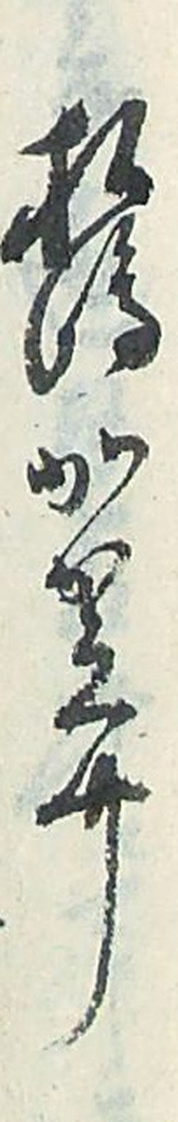松嶋加賀介
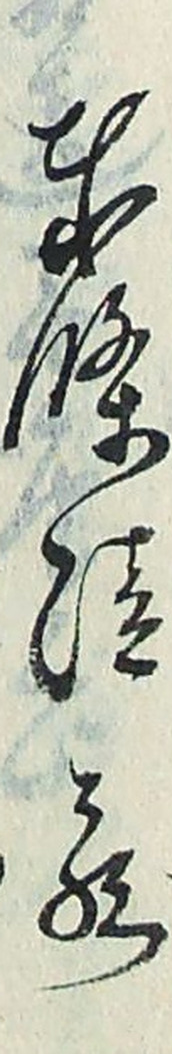東條清蔵
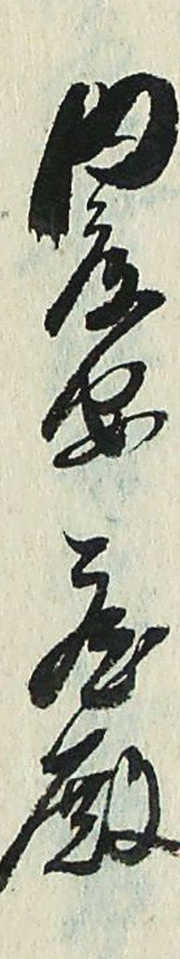内藤安蔵殿
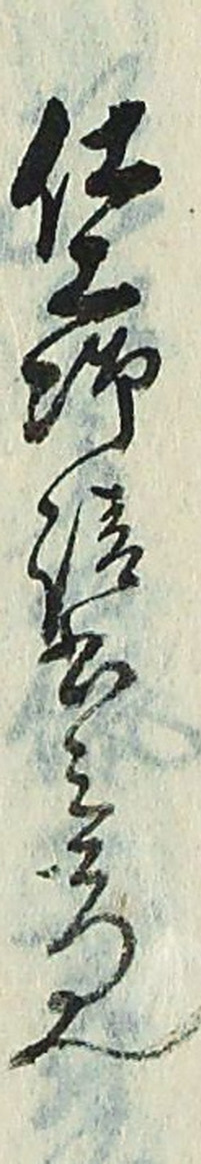○仕上御請書之覚
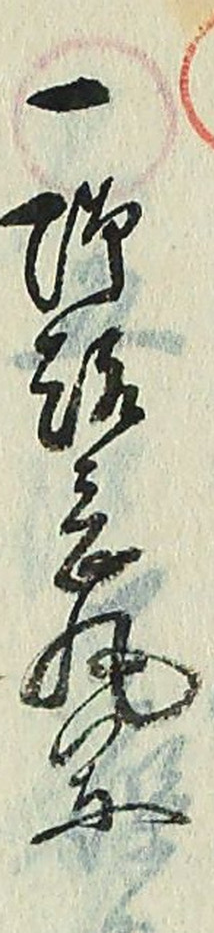一御趣意丸写
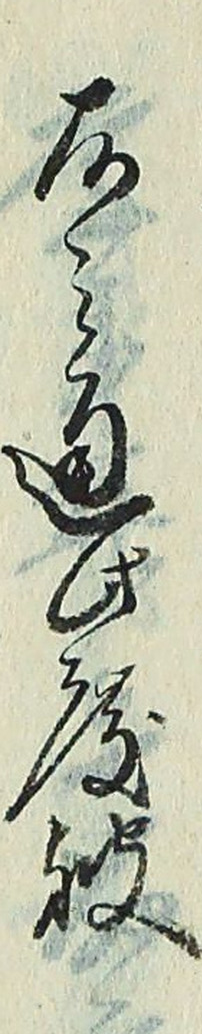右之通此度被
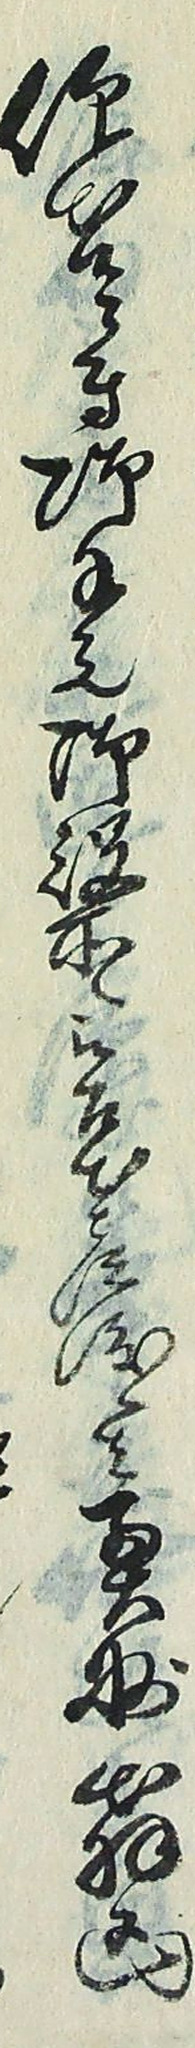仰出候ニ付御手元御役所へ被召出被仰渡候者奥州出羽凶
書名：諸御趣意書并御下知向之写
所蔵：鳴門教育大学 Naruto University of Education
